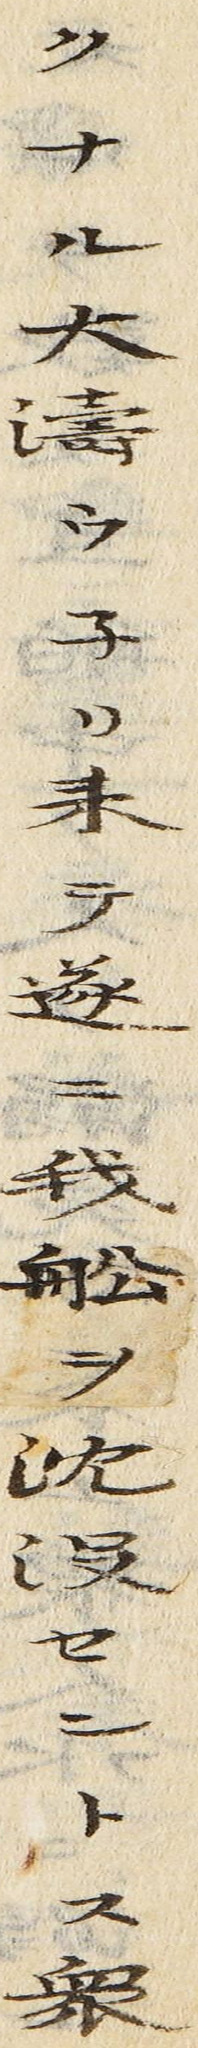クナル大濤ウネリ来テ遂ニ我船ヲ沈没セントス衆
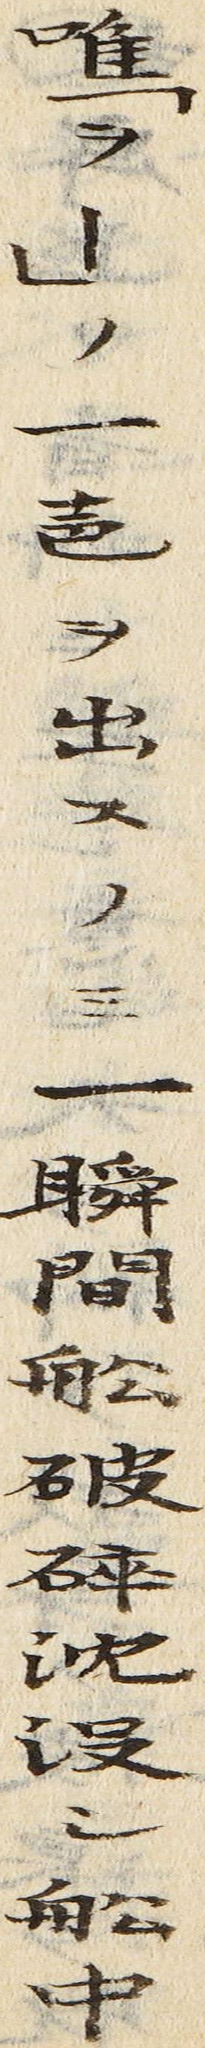唯「ヲー」ノ一声ヲ出スノミ一瞬間船破砕沈没シ船中
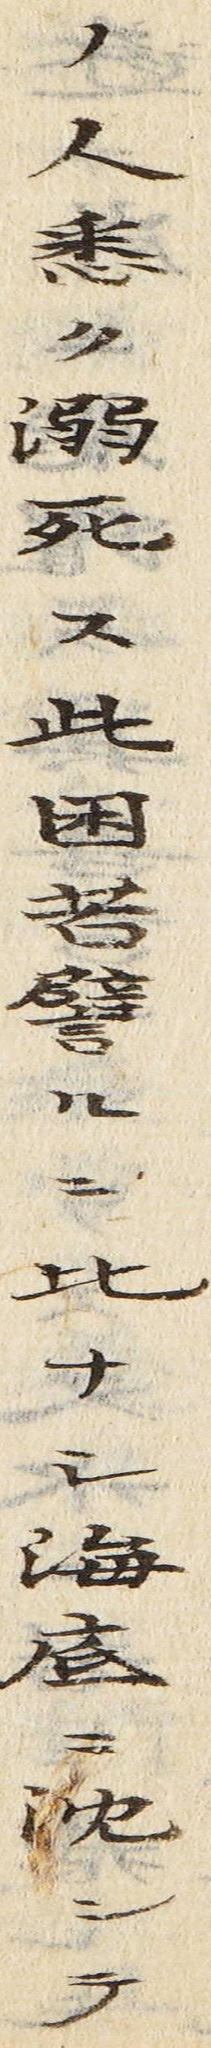ノ人悉ク溺死ス此困苦譬ルニ比ナシ海底ニ沈ンテ
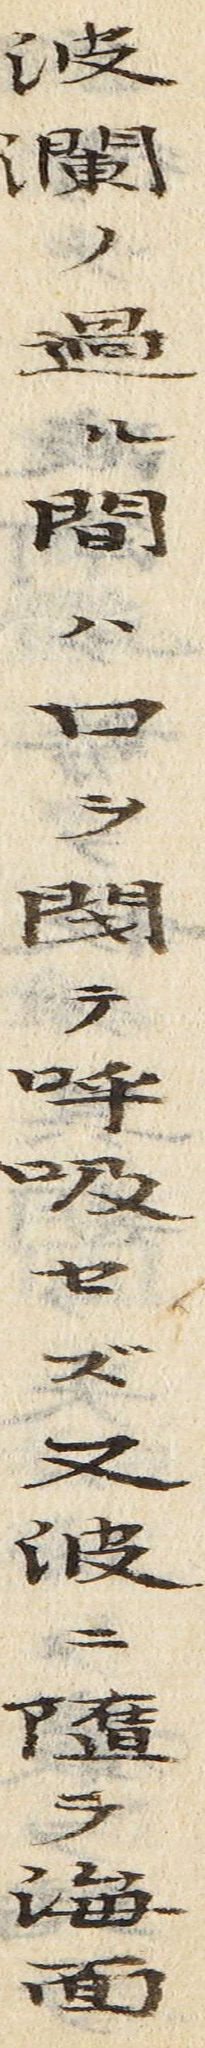波瀾ノ過ル間ハ口ヲ閉テ呼吸セズ又波ニ随テ海面
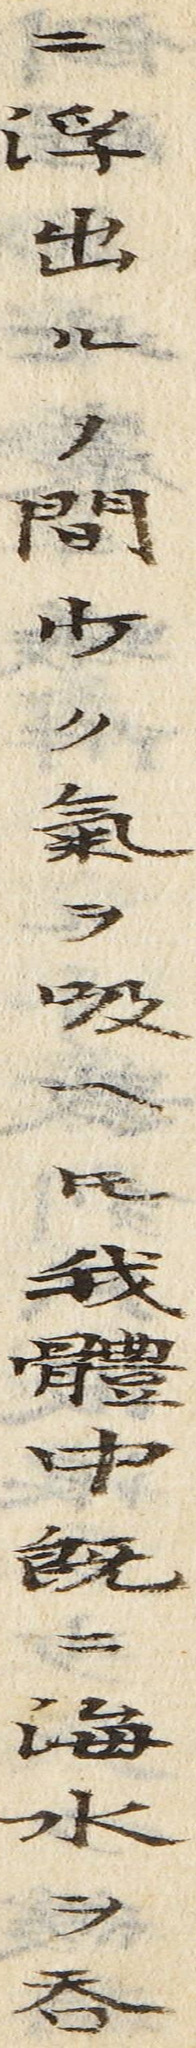ニ浮出ルノ間少ク気ヲ吸ヘトモ我体中既ニ海水ヲ呑
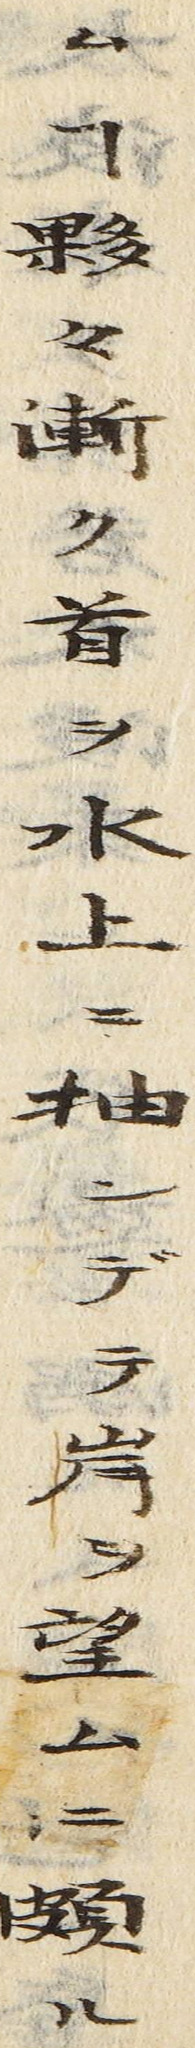ムコト夥々漸ク首ヲ水上ニ抽ンデテ岸ヲ望ムニ頗ル
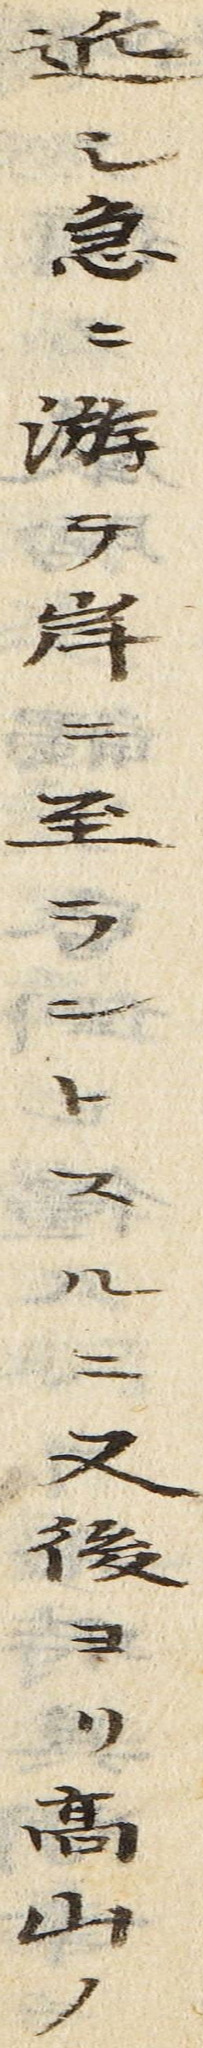近シ急ニ游テ岸ニ至ラントスルニ又後ヨリ高山ノ
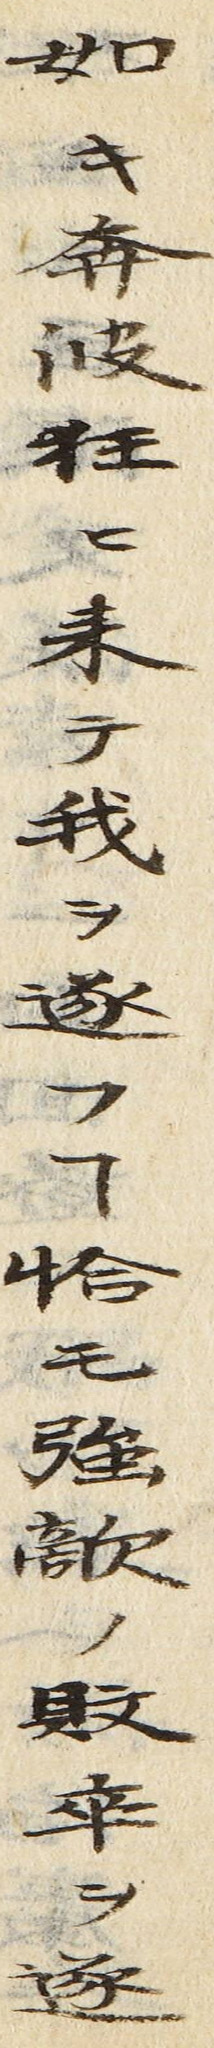如キ奔波狂ヒ来テ我ヲ逐フコト恰モ強敵ノ敗卒ヲ逐
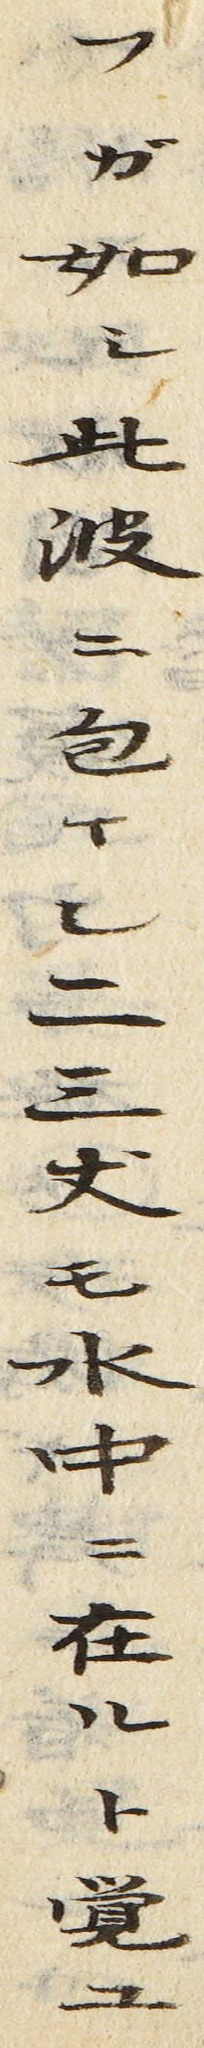フガ如シ此波ニ包マレ二三丈モ水中ニ在ルト覚ユ
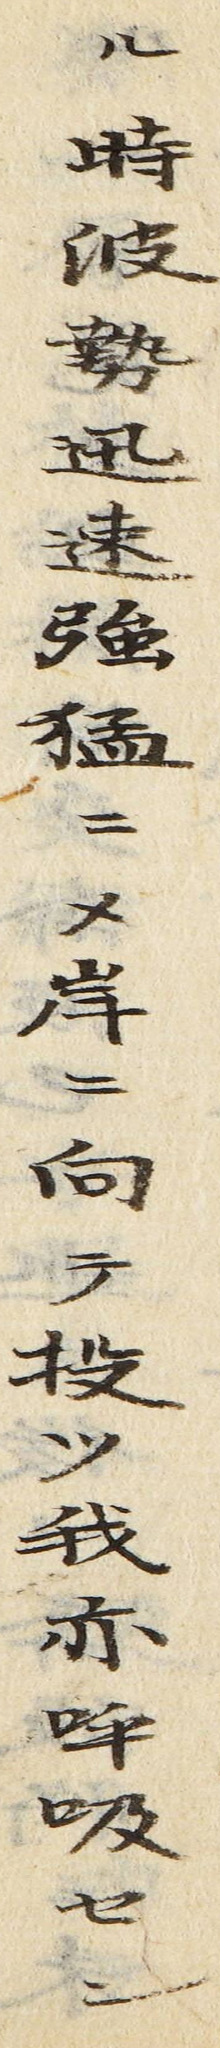ル時波勢迅速強猛ニ岸ニ向テ投ツ我亦呼吸セン
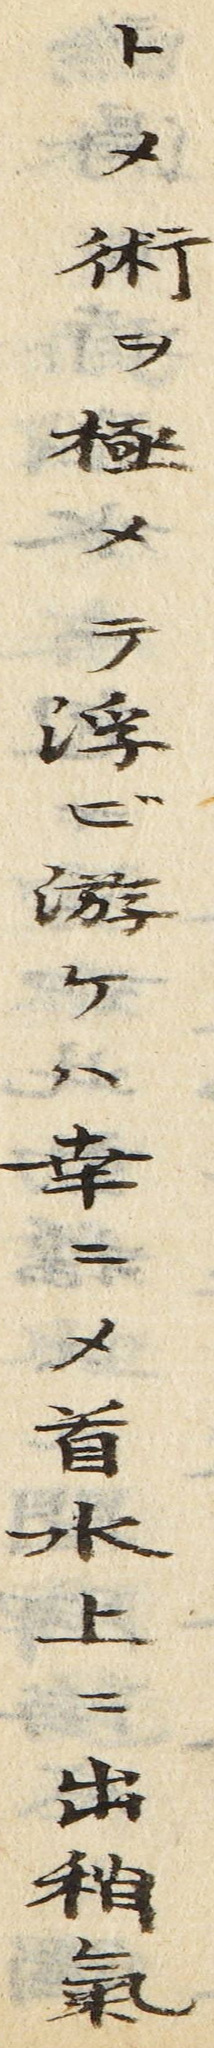トシテ術ヲ極メテ浮ビ游ケハ幸ニシテ首水上ニ出稍気

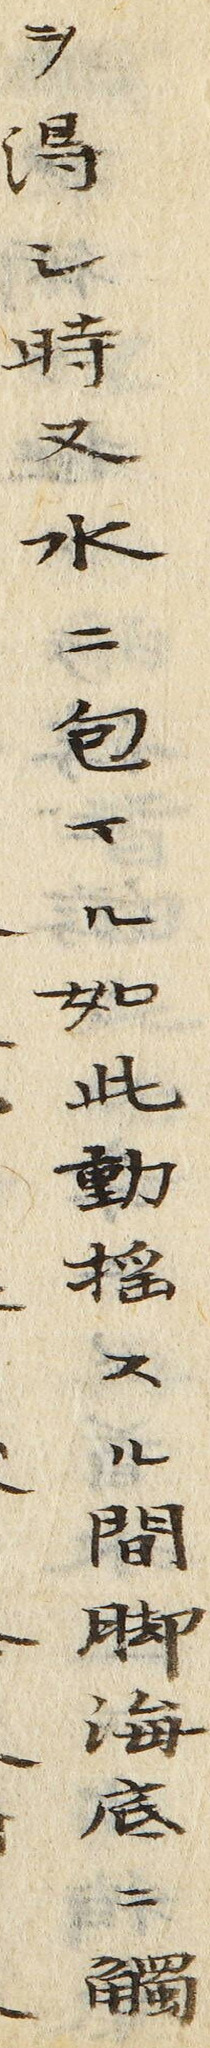ヲ得シ時又水ニ包マル如此動揺スル間脚海底ニ触
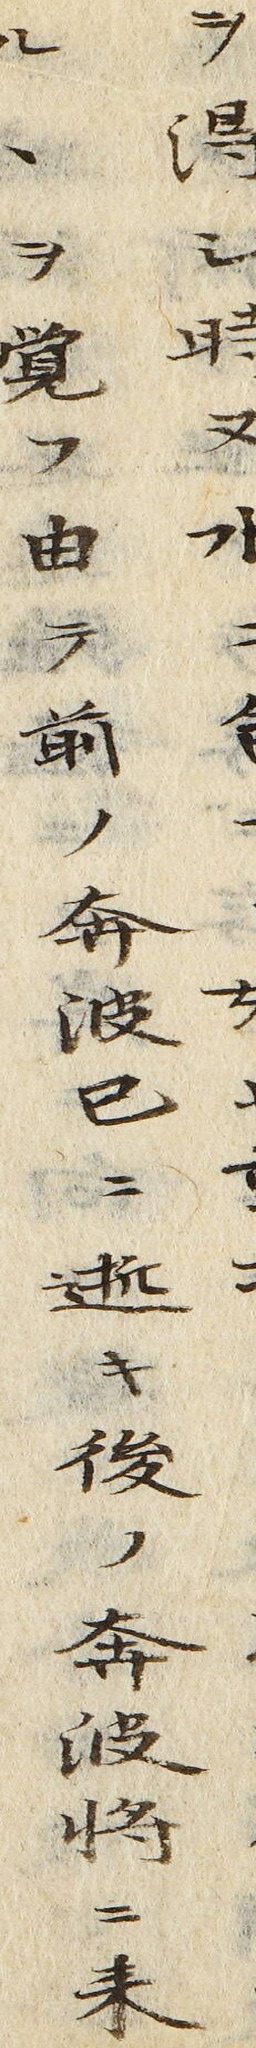ルヽヲ覚フ由ヲ前ノ奔波已ニ逝キ後ノ奔波将に来
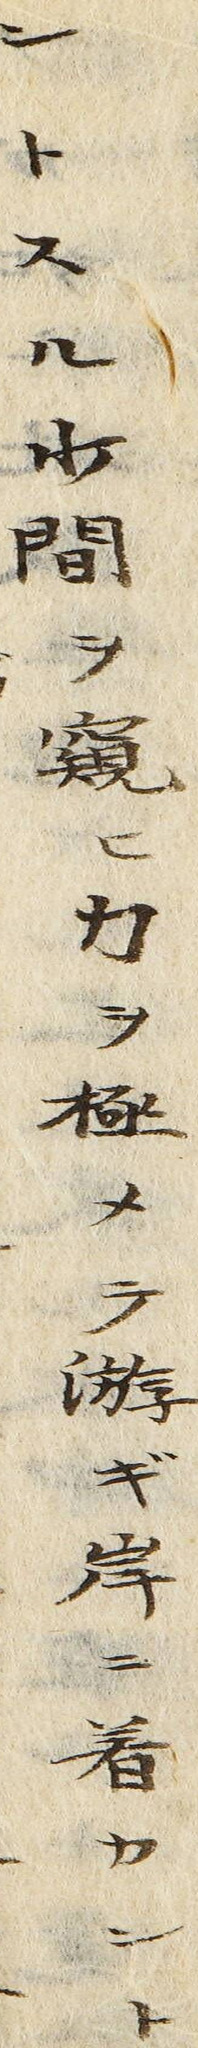ントスル少間ヲ窺ヒ力ヲ極メテ游ギ岸ニ着カント
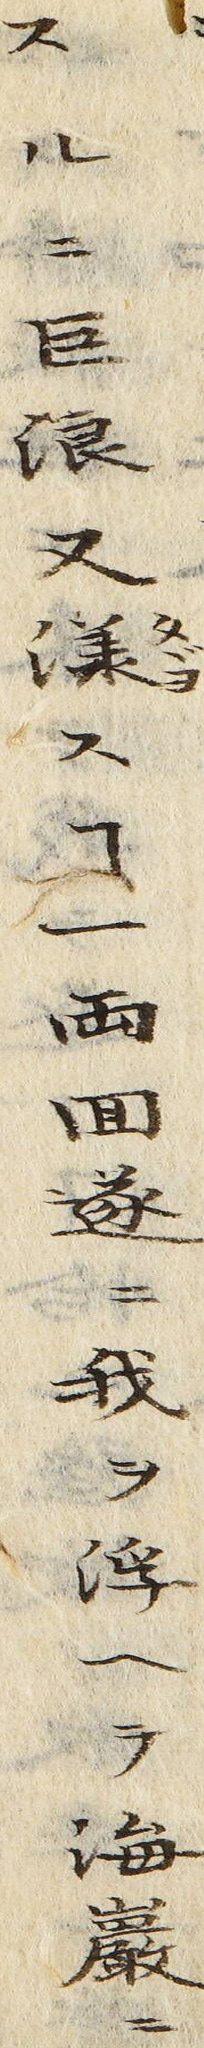スルニ巨浪又漾スコト一両回遂ニ我ヲ浮ヘテ海巌ニ
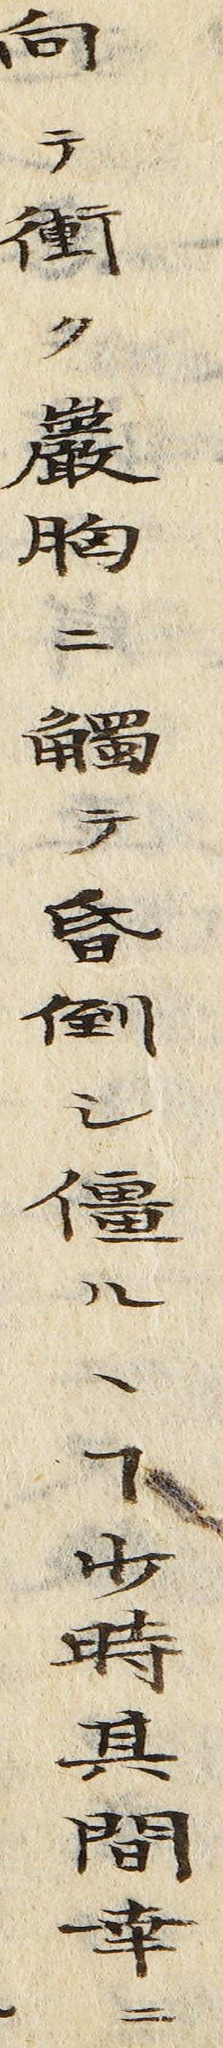向テ衝ク巌胸ニ触テ昏倒シ僵ルヽコト少時其間幸ニ
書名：漂流紀事
